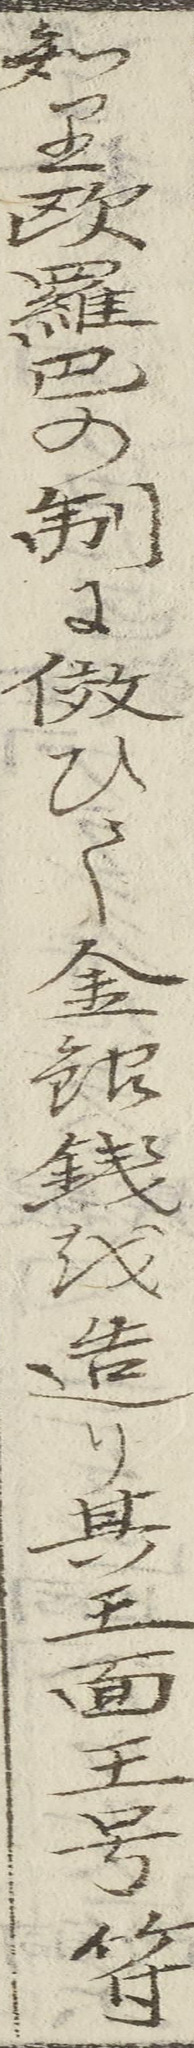しり欧羅巴の制に倣ひて金銀銭を造り其面王如号符
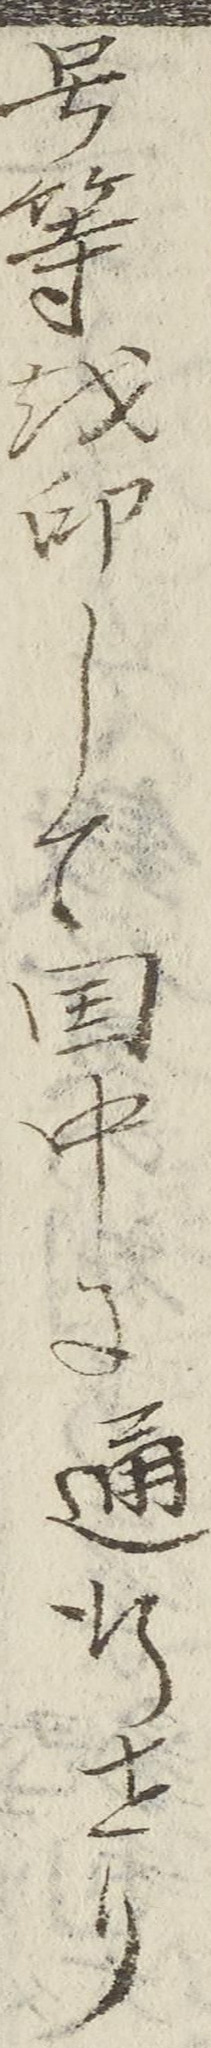号等を印して国中に通行せり
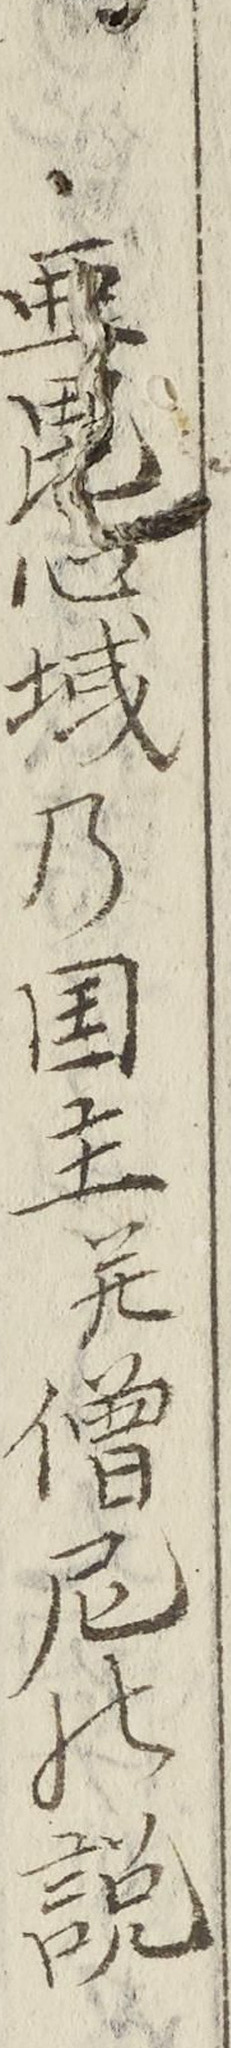亜毘心域の国主并僧尼の説
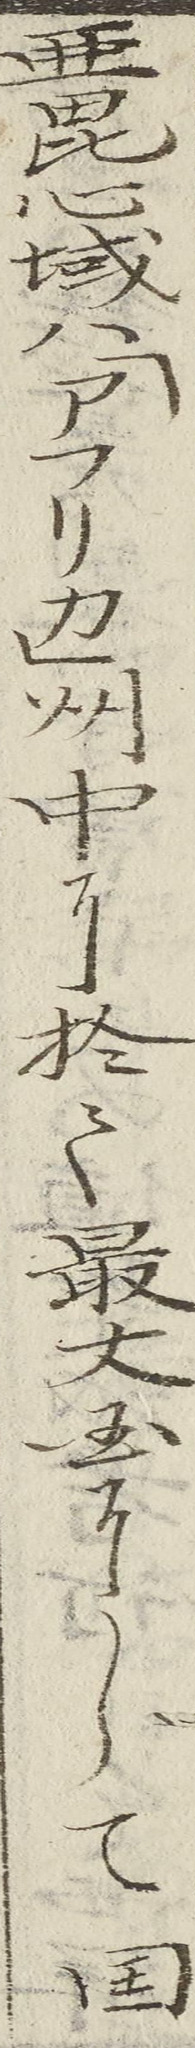亜毘心域ハ「アフリカ」州中に於て最大国にして国
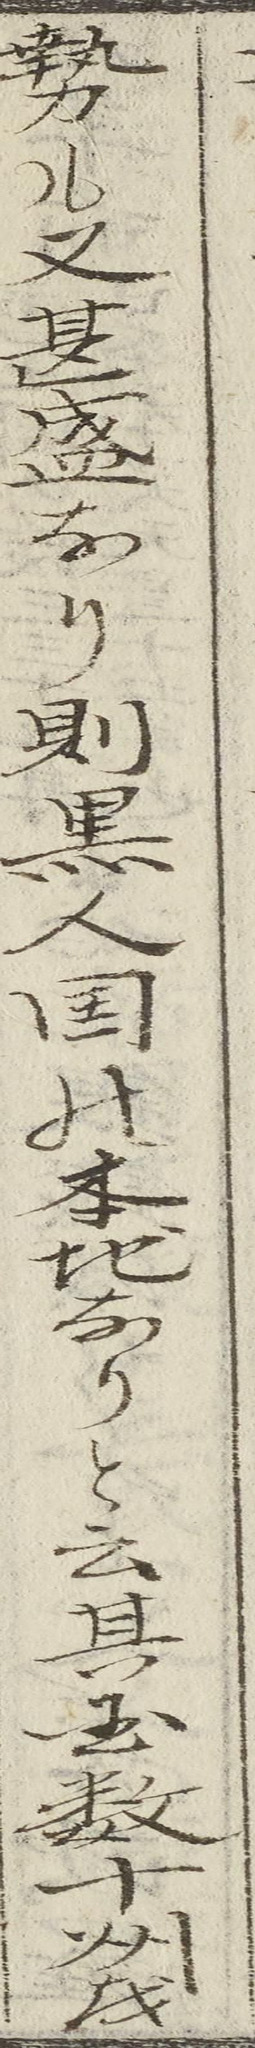勢も又甚盛なり則黒人国の本地なりと云其国数十州を
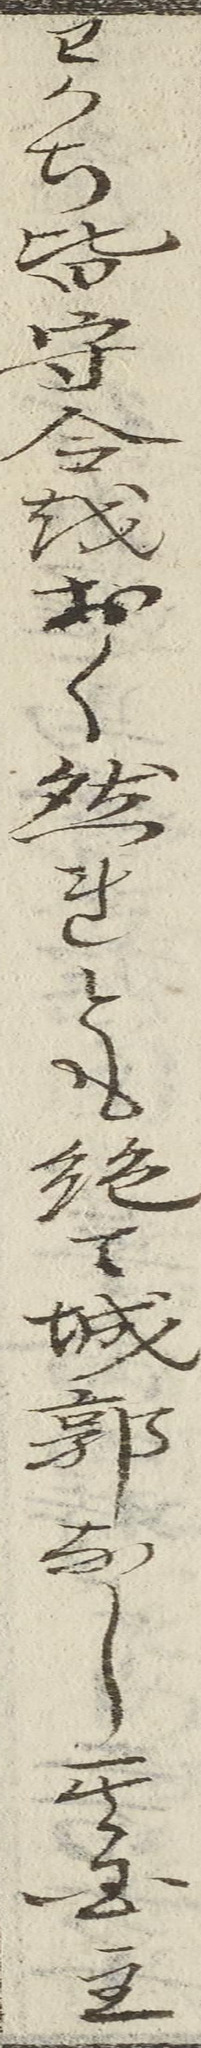わかち皆守令をおく然れとも絶て城郭なし其国主
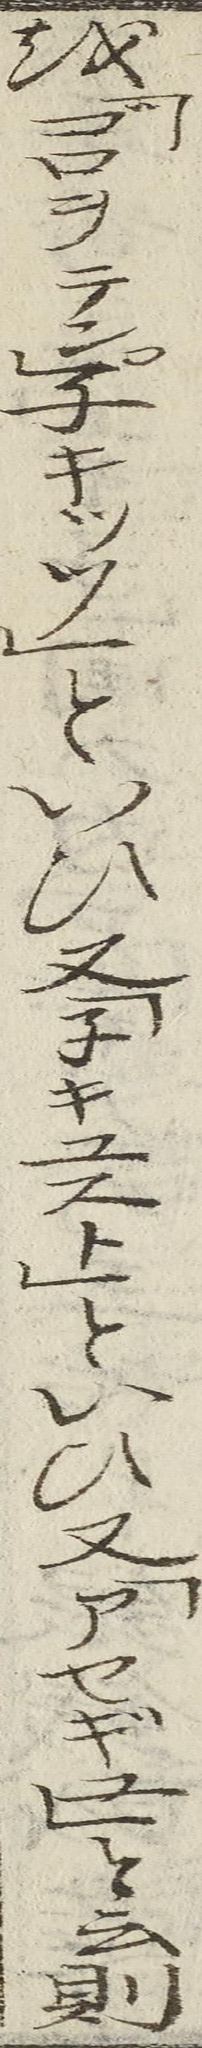を「ゴロヲテン。」子キッツ」といひ又「子キユスト」といひ又「アセギユ」と云則
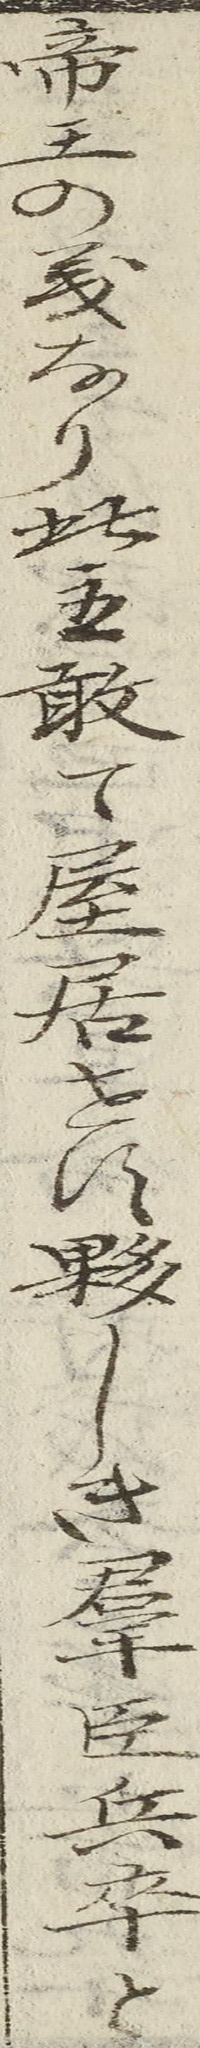帝王の義なり此有敢て屋居をす夥しき群臣兵卒と
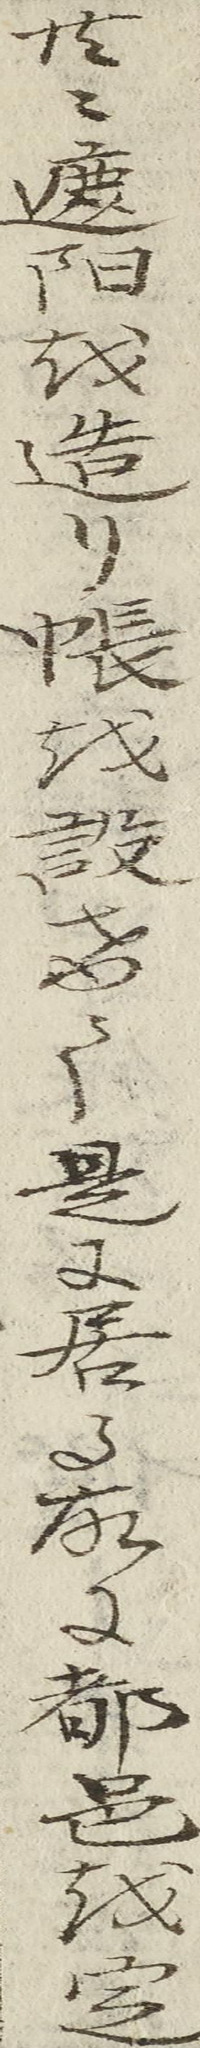共二遮阳を造り帳を設けて是に居る故に都邑を定
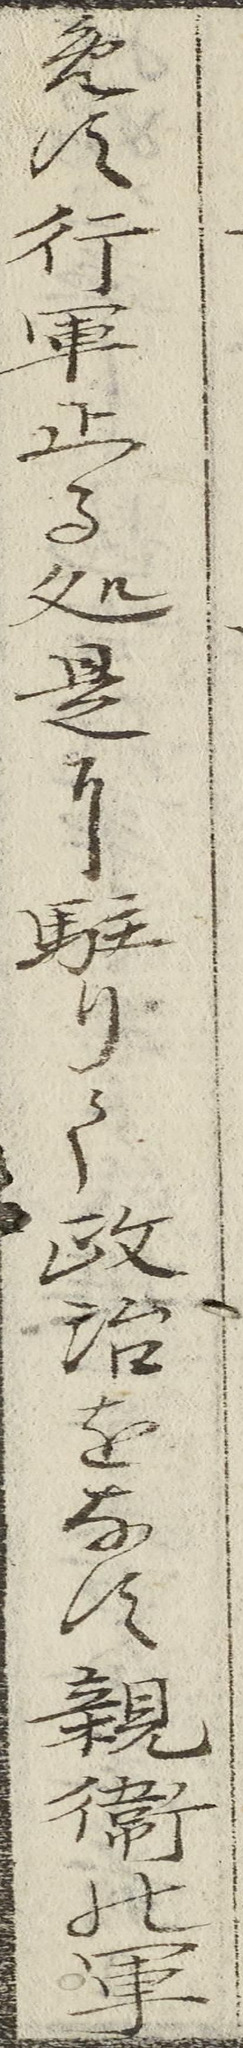めす行軍止る処是に駐りて政治をなす親衛の軍
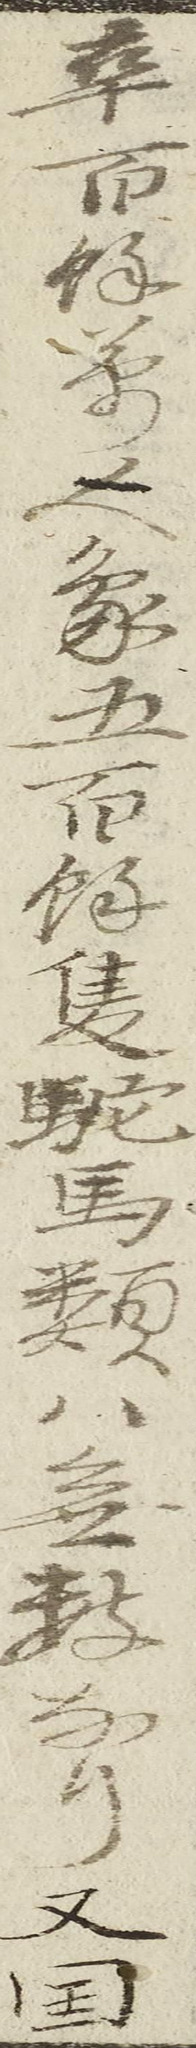卒百餘栄へ象五百餘隻駝馬類ハ無数なり又国
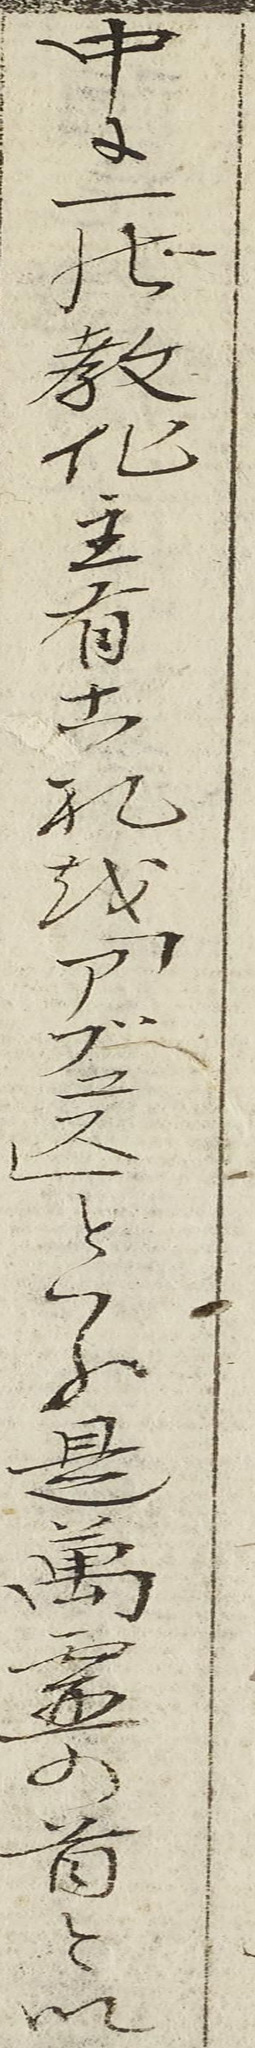中に一の教化主有これを「アブュス」といふ是万霊の首とい
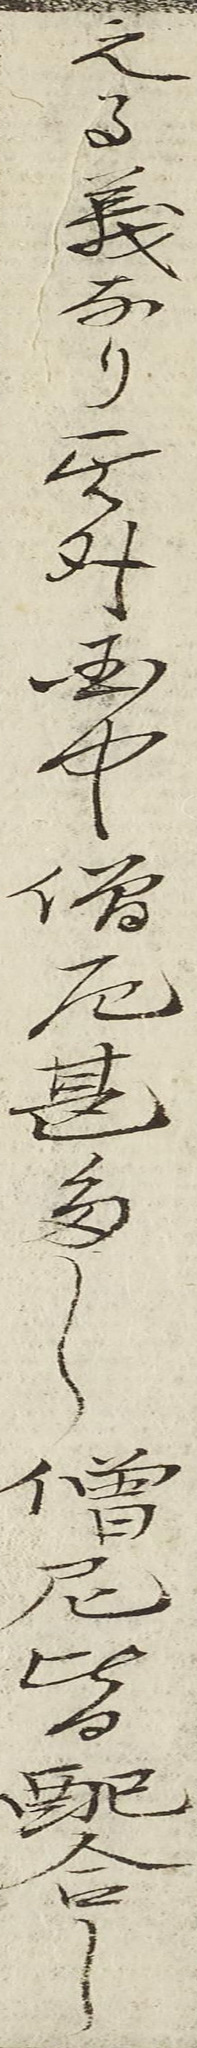える義なり其外国中僧尼甚多し僧尼皆配合し
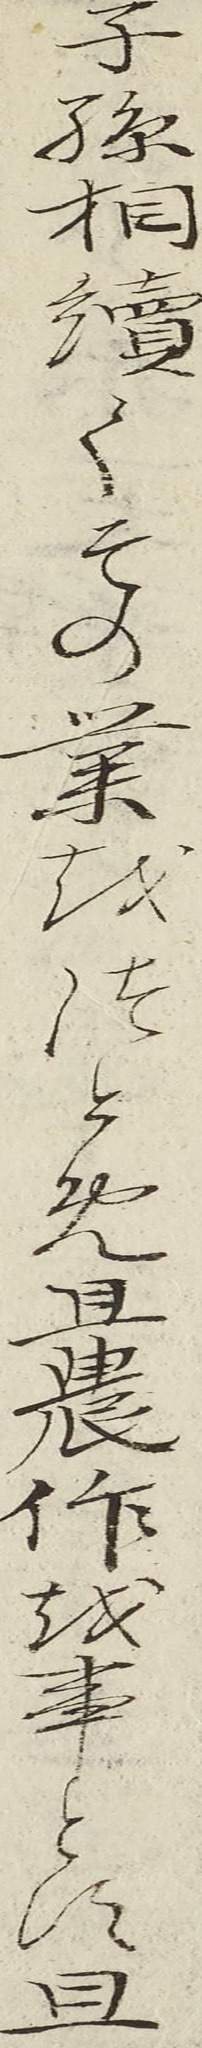子孫相続くその業をつとめ且農作を事とす且
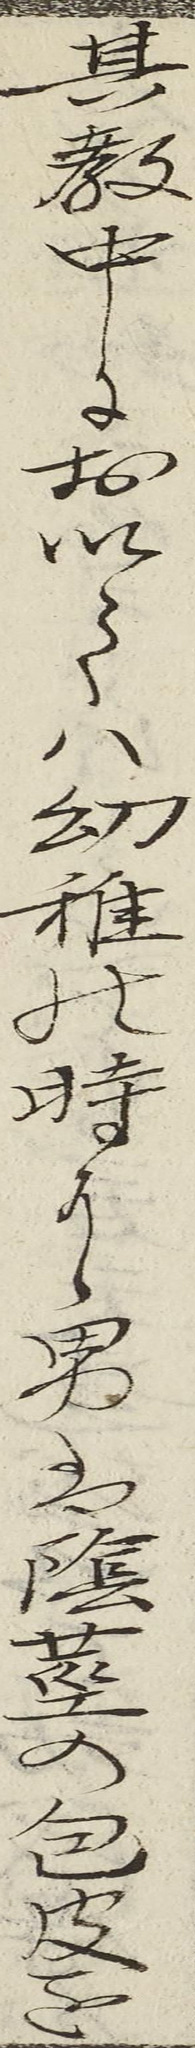其教中においてハ幼稚の時に男は陰茎の包皮を
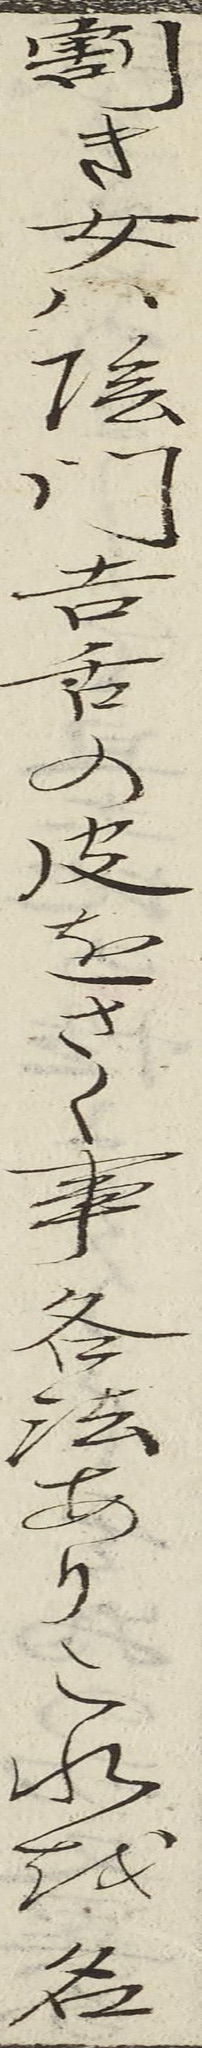割き女ハ陰門吉舌の皮をさく事各法ありこれを名
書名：西洋雜記　坤
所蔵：東京大学地震研究所図書室 Earthquake Research Institute Library, The University of Tokyo, JAPAN
